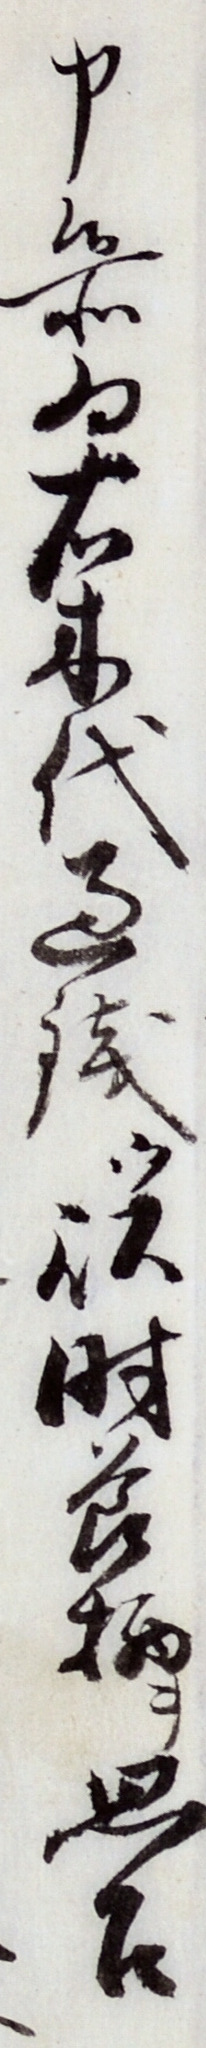申候所為右木代過銭ヲ以時節柄ヲ思召
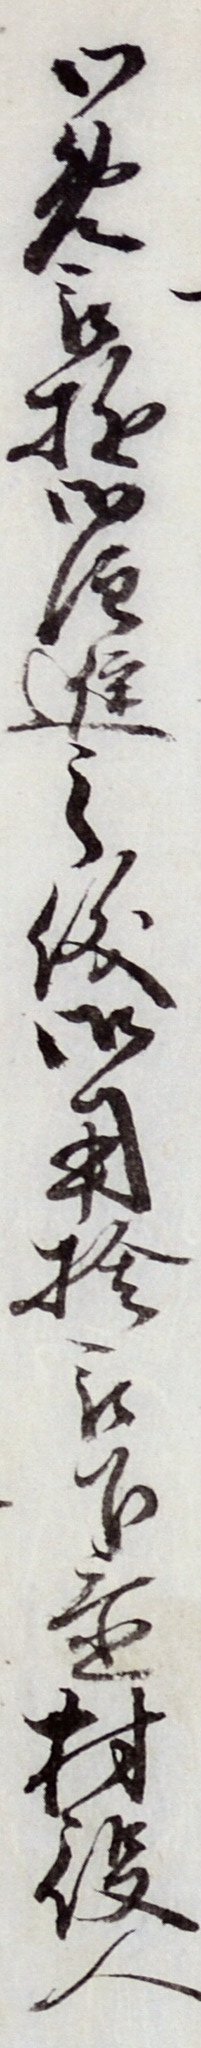御免被遊御注進之儀御用捨被下置村役人

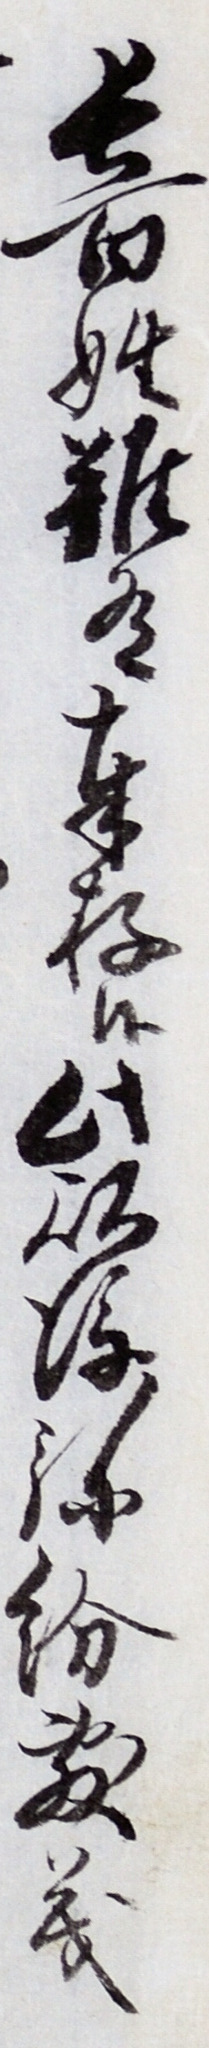長百姓難有奉存候此以後弥紛敷義
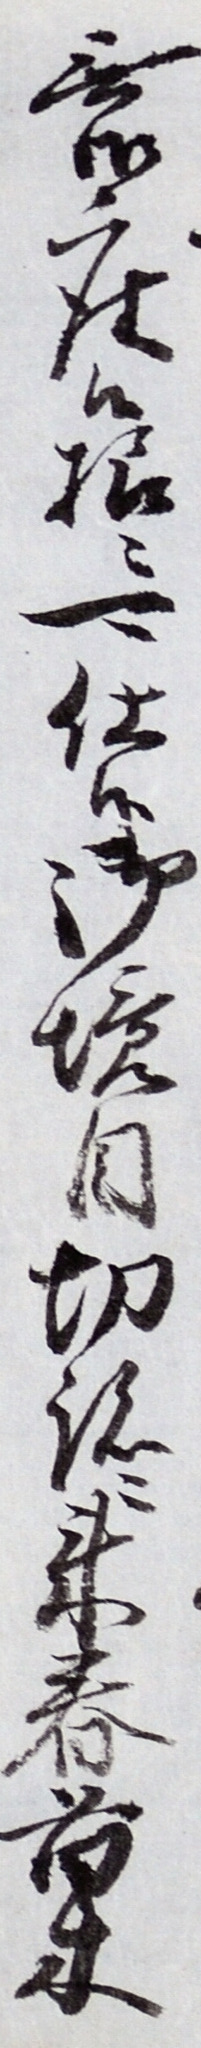無御座候様ニ可仕候御境目切跡ニ来春苗木
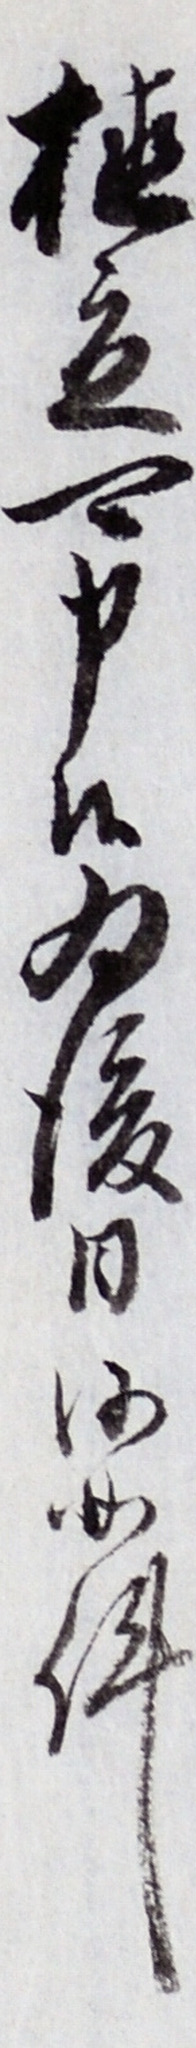植立可申候為後日仍如件
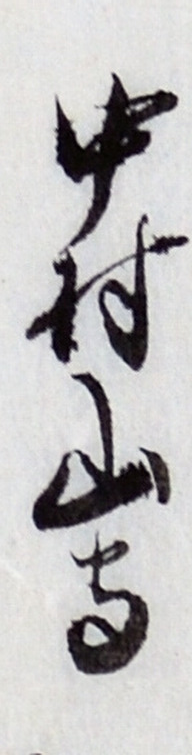中村山守
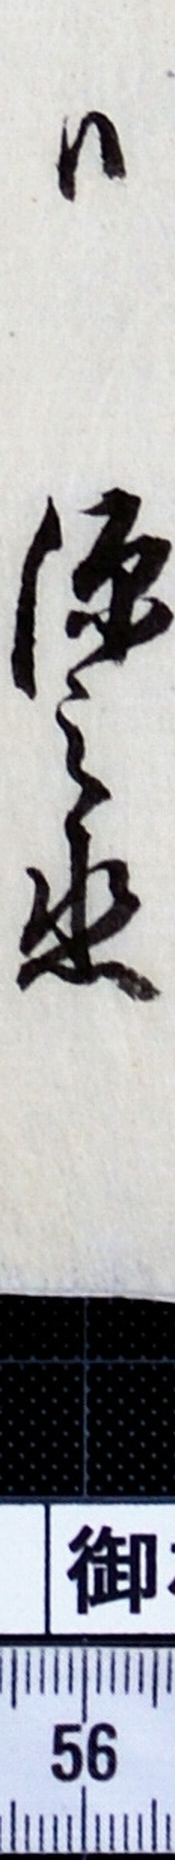同源之丞
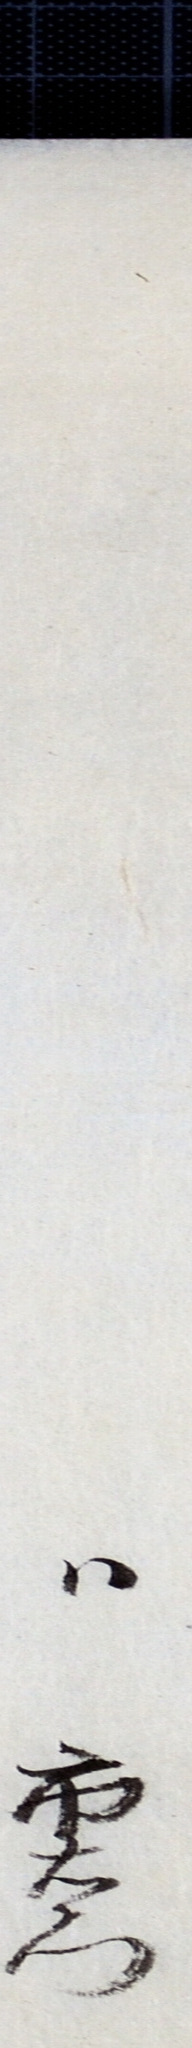同市右衛門
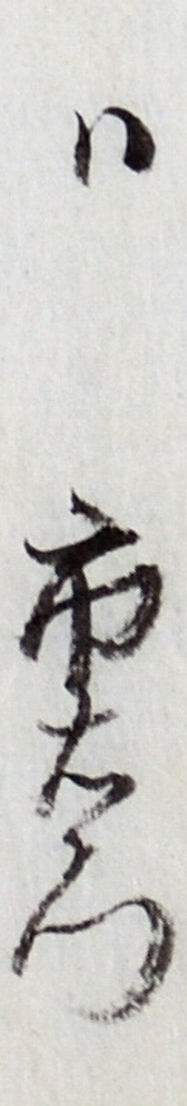同市右衛門
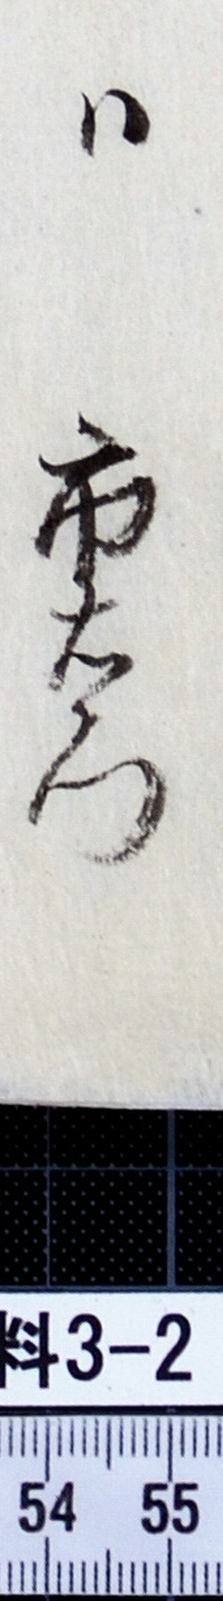同市右衛門
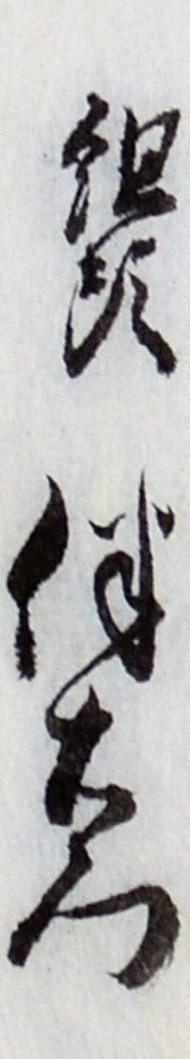組頭伴右衛門
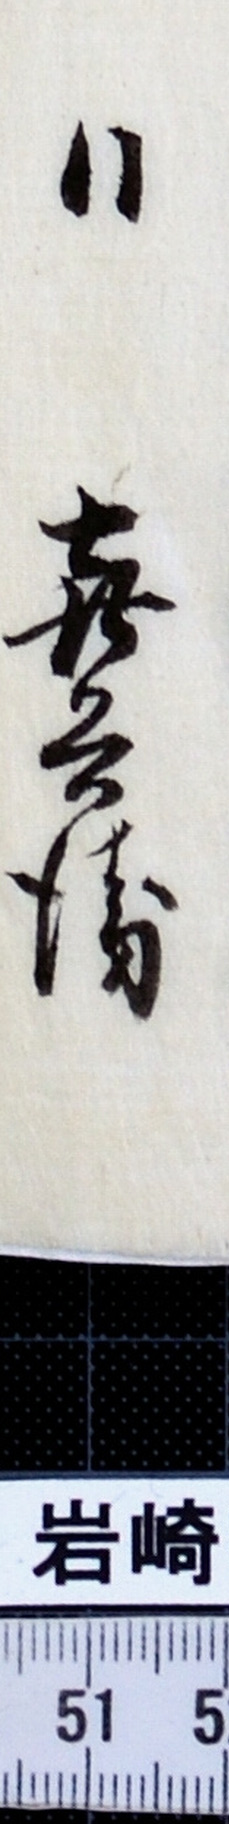同喜兵衛
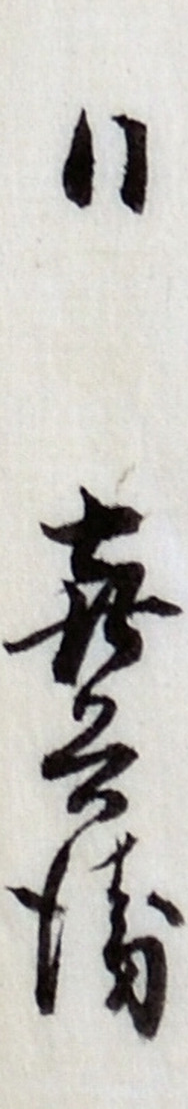同喜兵衛
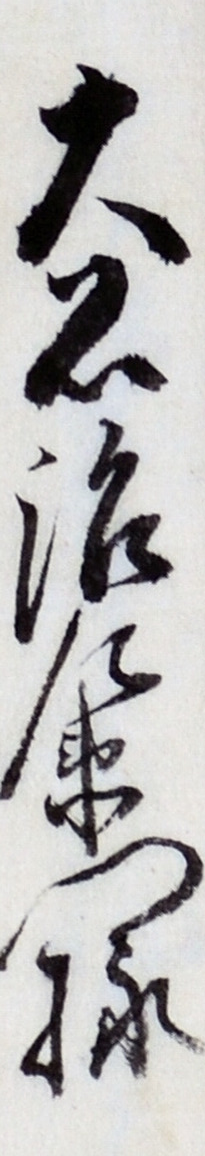大石治左衛門様
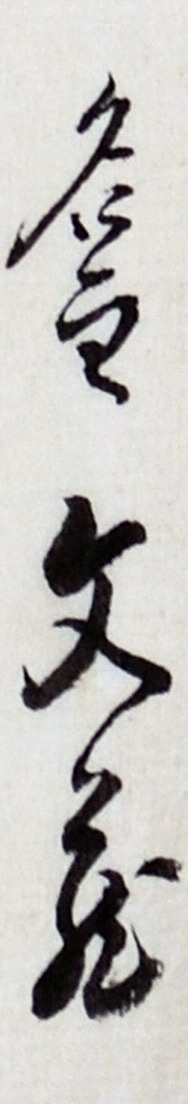名主文蔵
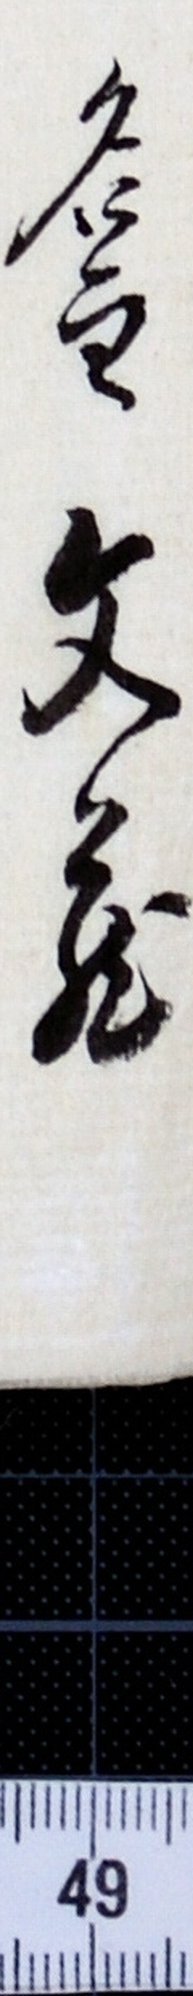名主文蔵
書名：御林御竹藪証文控
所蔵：伊那市立高遠町図書館・合同会社AMANE
